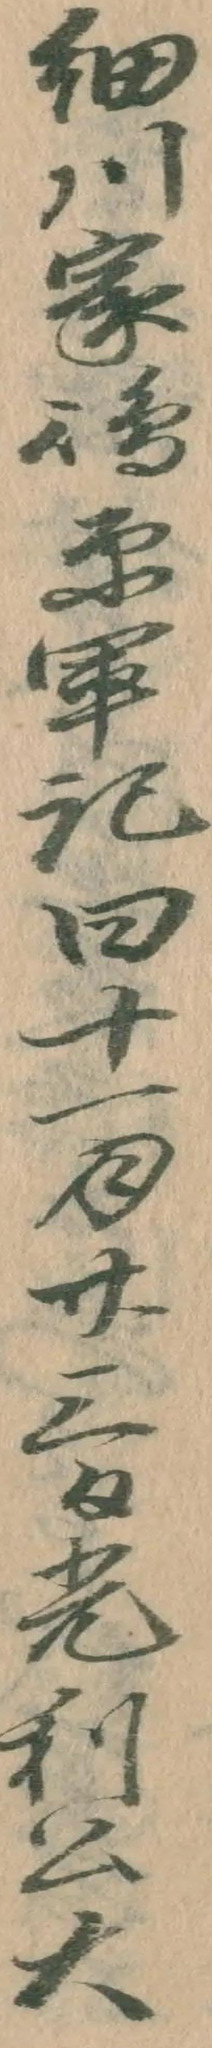細川家島原軍記曰十一月廿三日光利公大
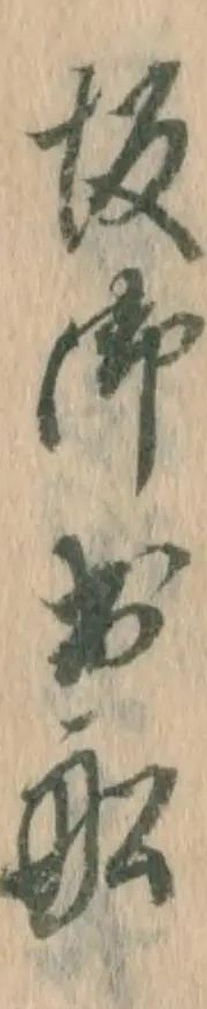坂御出船
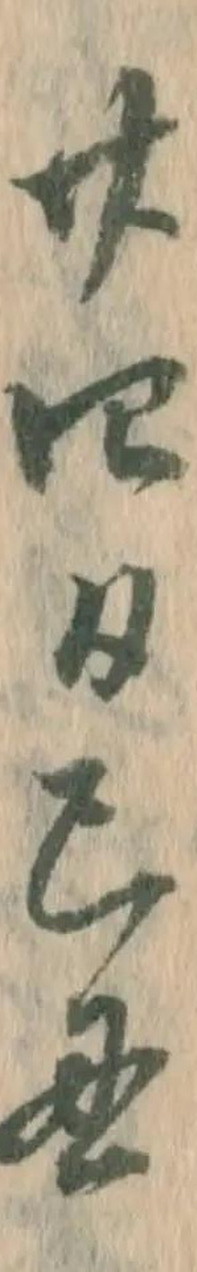廿四日己丑
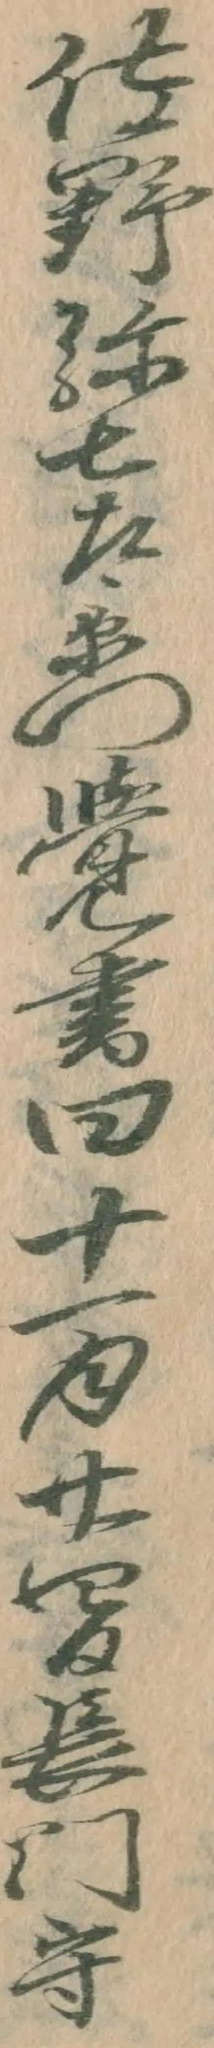佐野弥七左衛門覚書曰十一月廿四日長門守
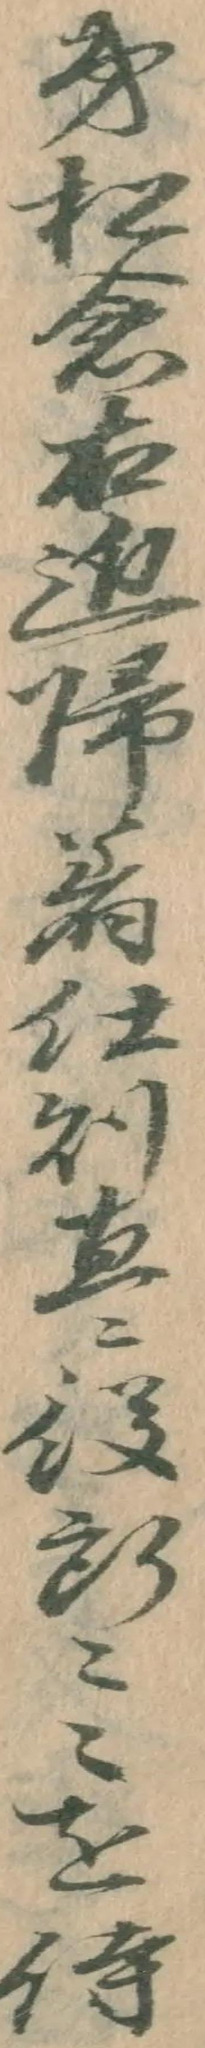弟板倉右近帰着仕則直に役所々々を侍
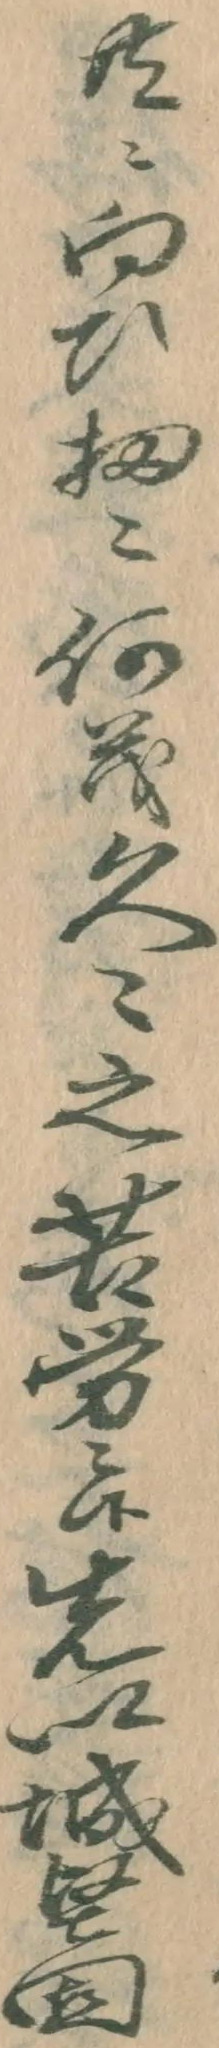共に向ひ扨々何も久々之苦労に候先以城堅固

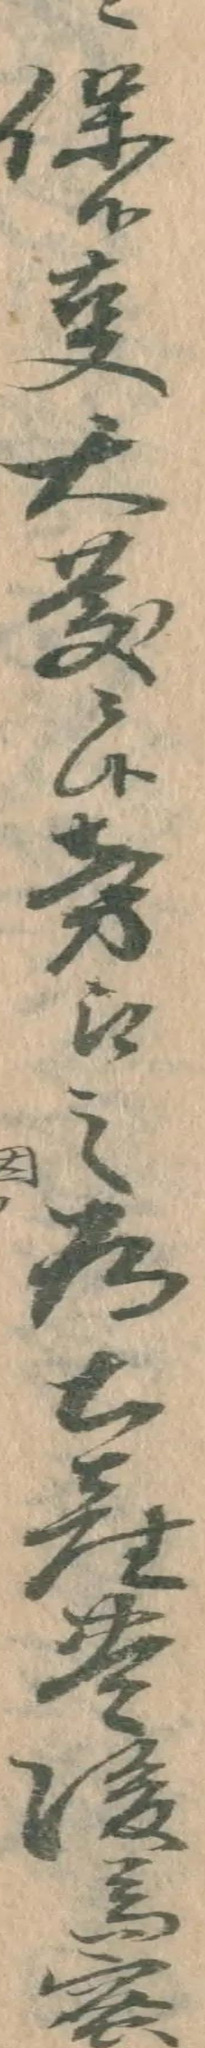に保候事大慶に候旁江之為土産豊後に而蜜
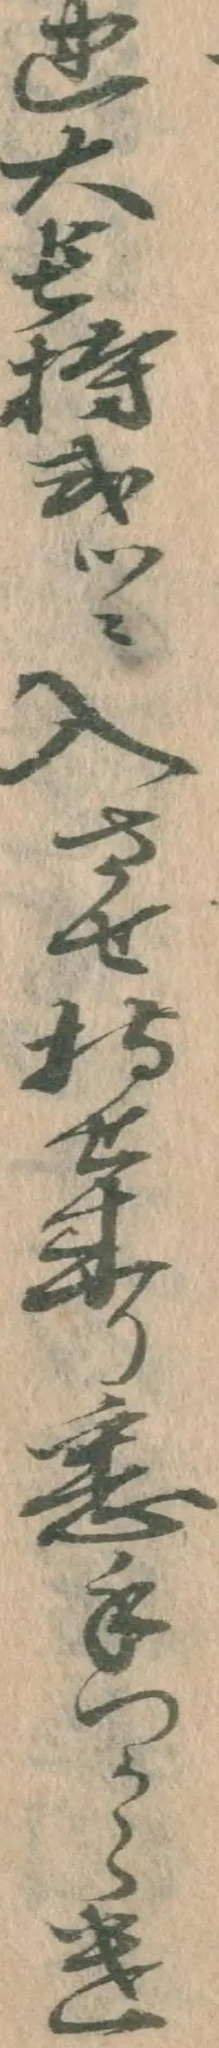迚大長持弐ッに入させ持せ来り悉手つから遣
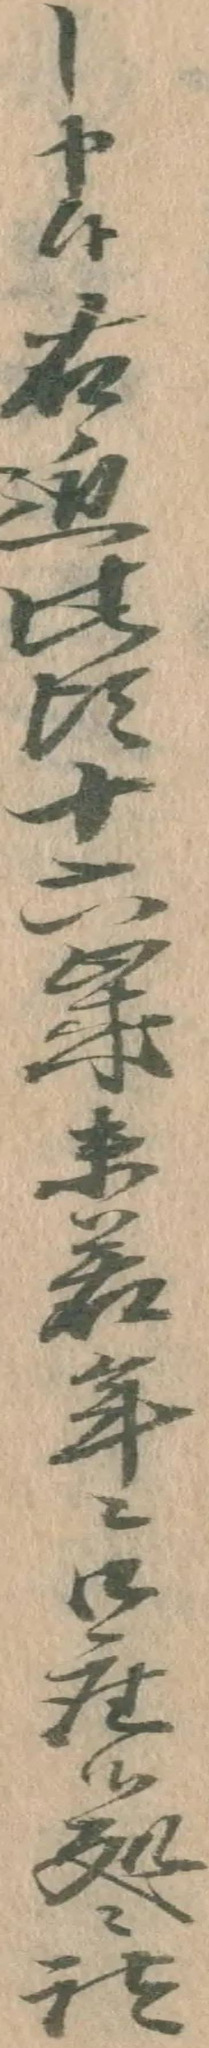し申候右近此頃十六歳未若年に御座候処に諸
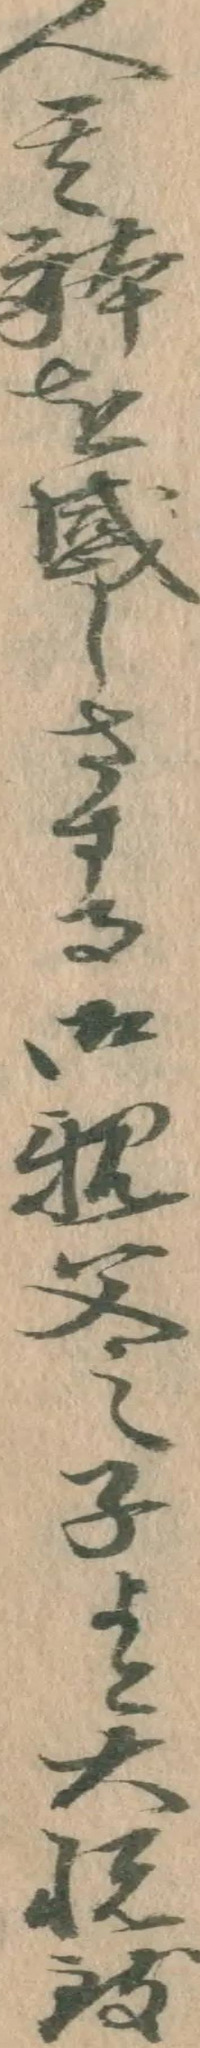人其体を感しさする御親父之子よと大悦致
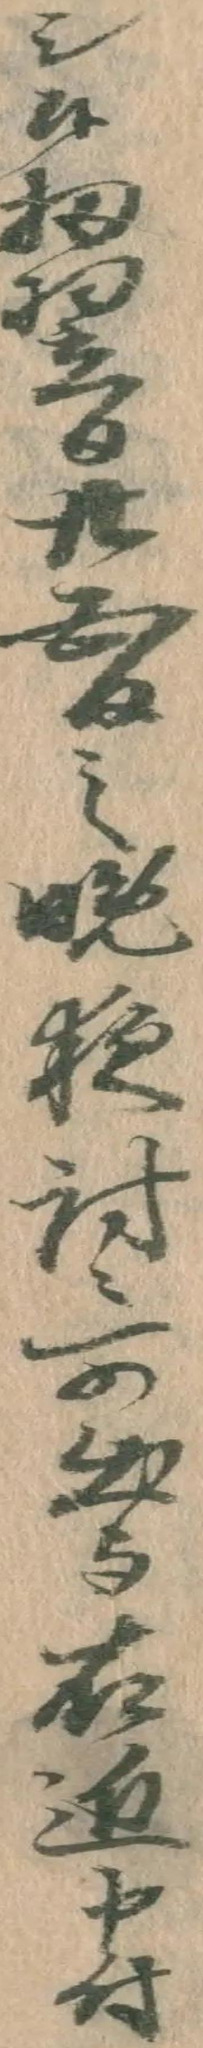シ候扨翌日廿五日之晩夜討に可出と右近申付
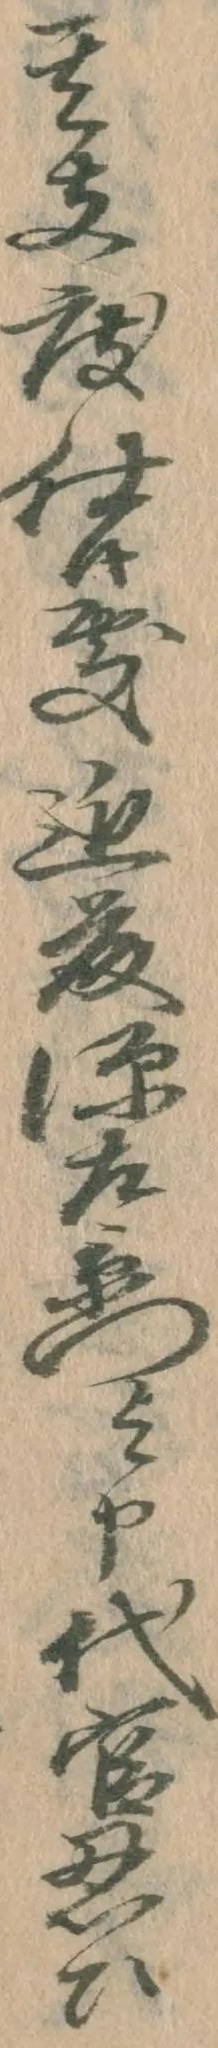其支度仕候処近藤源左衛門と申代官忍ひ
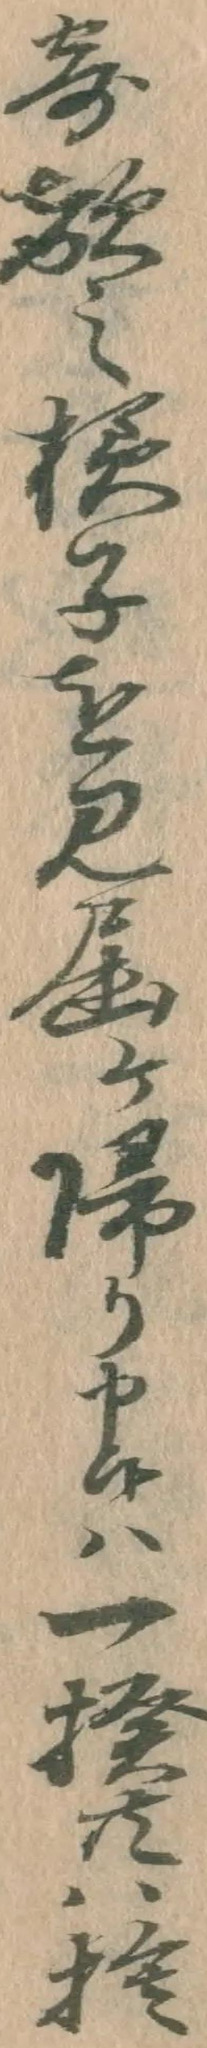寄敵之様子を見届ケ帰り申候は一揆共は捨
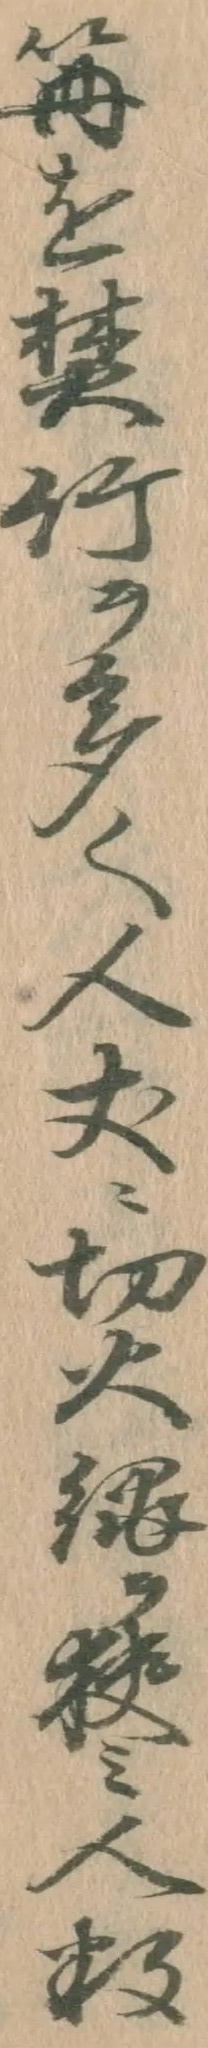笧を焚竹ヲ多く人丈に切火縄ヲ挟み人数
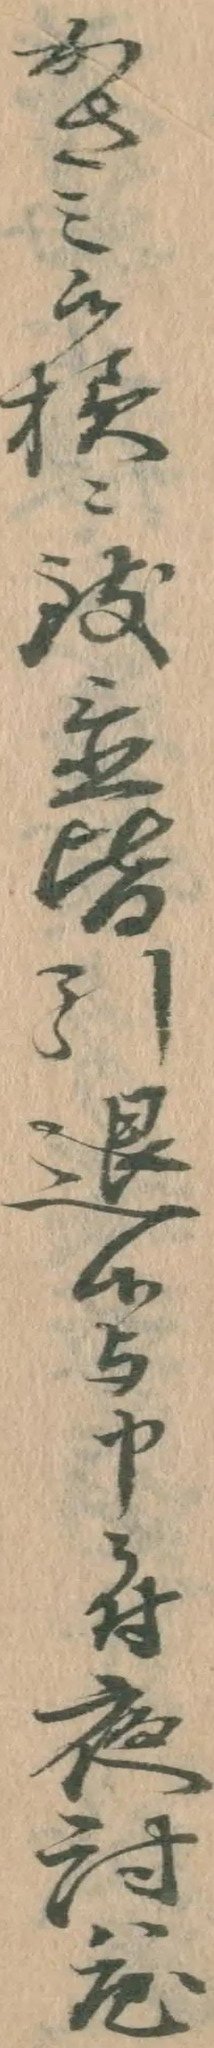かさみ候様に致置皆引退候と申に付夜討はや
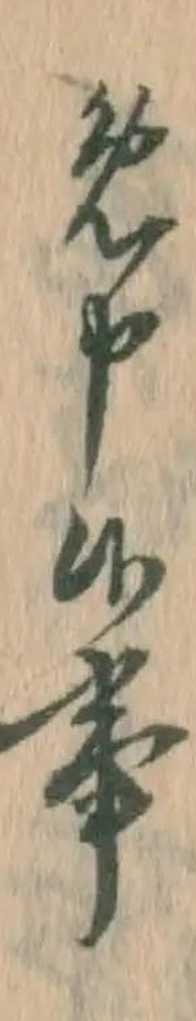め申候事
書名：切支丹御退治記 49巻. [3]
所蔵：国立国会図書館 National Diet Library, JAPAN
